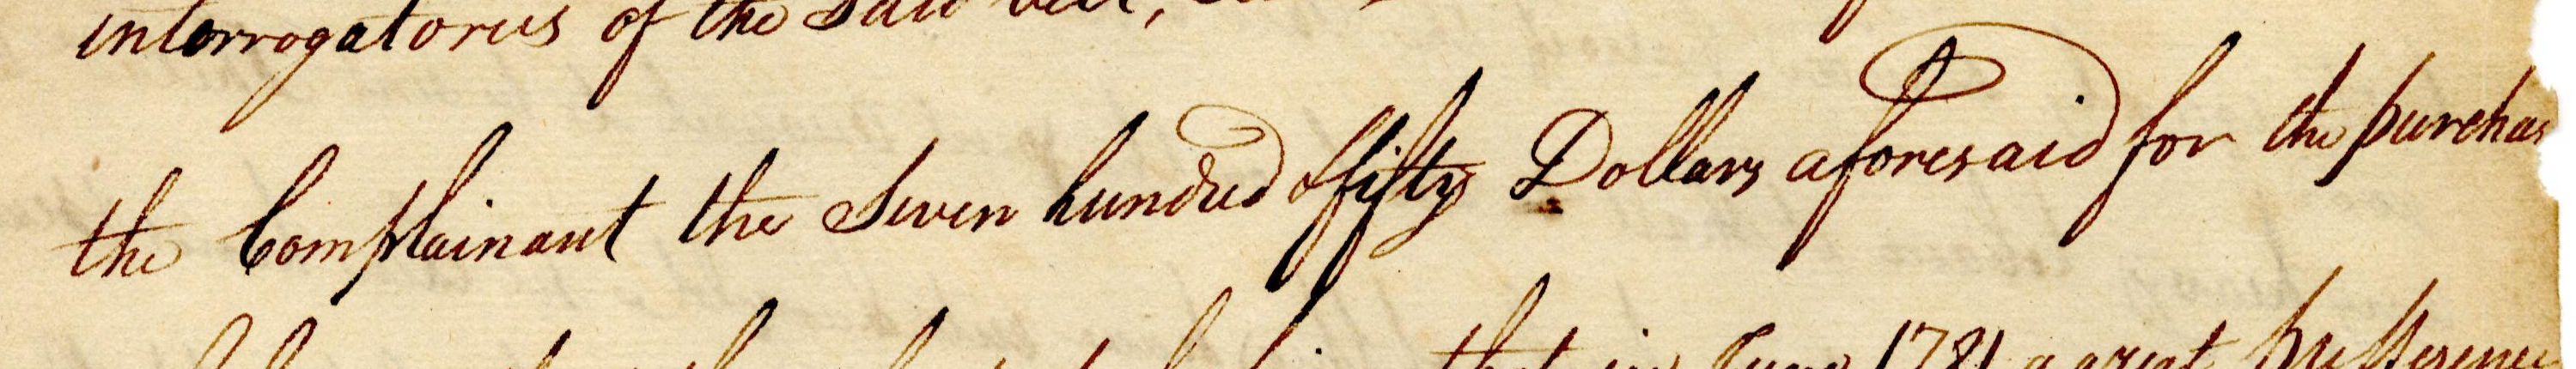the complainant the Seven hundred & fifty Dollars aforesaid for the purchas
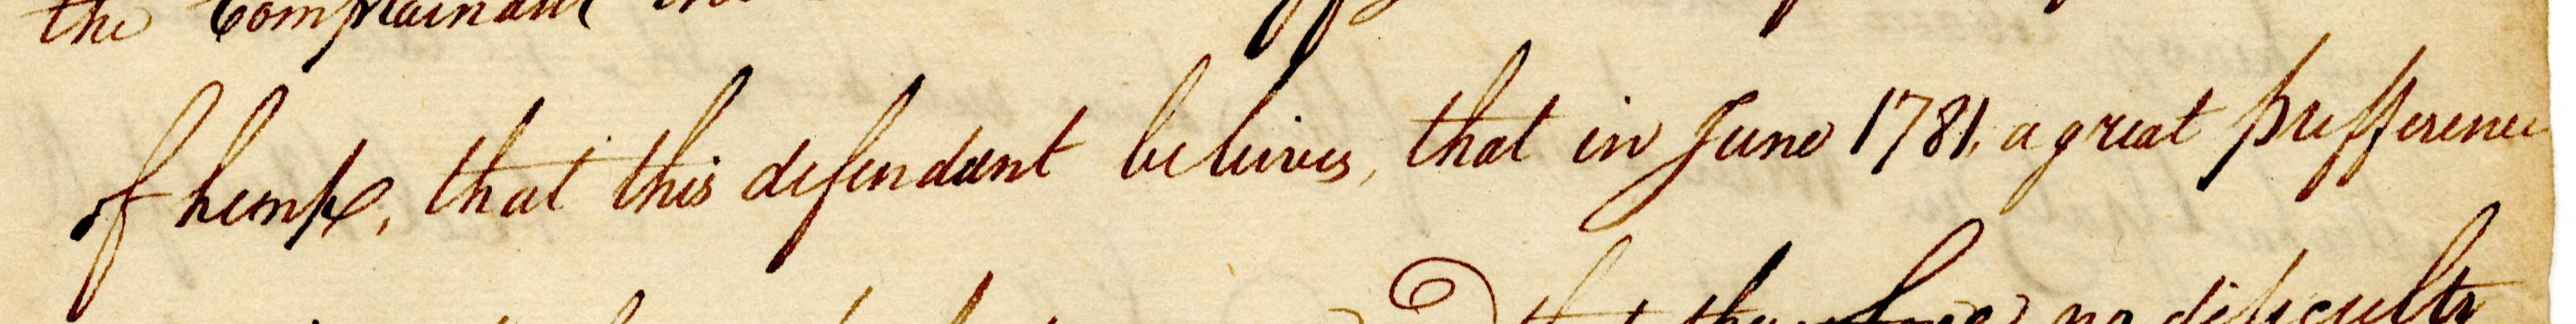of hemp, that the defendant believes, that in June 1781 against prefference
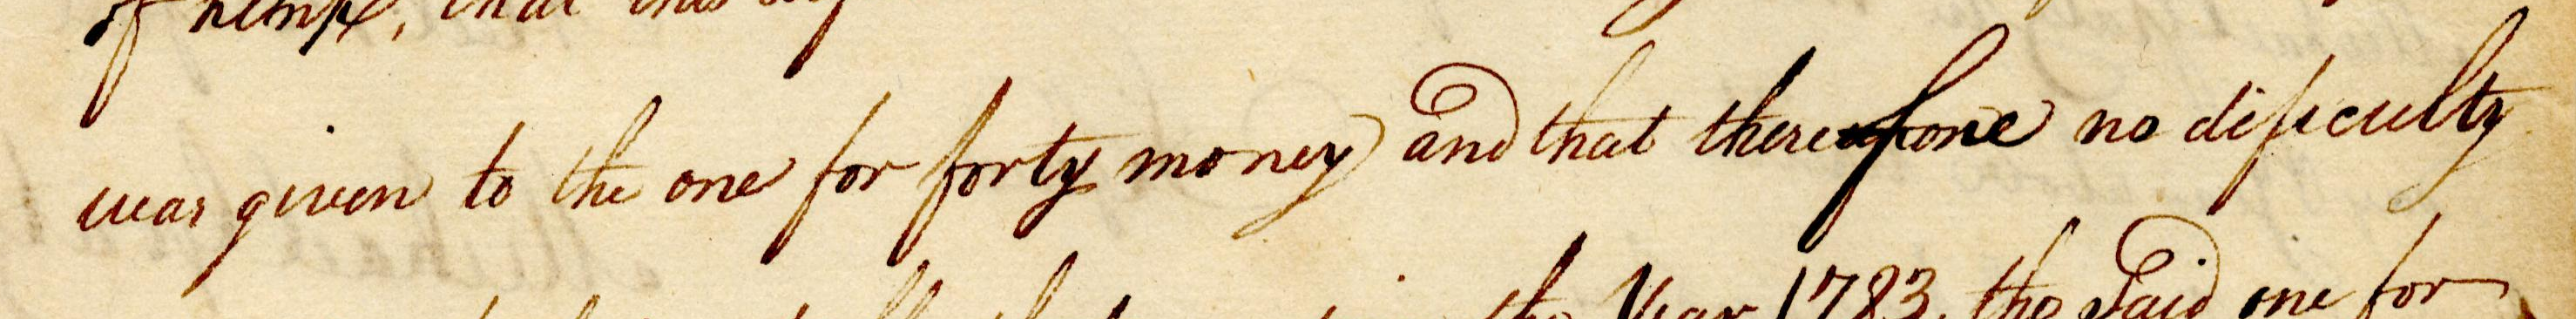was given to the one for forty money and that therefore no difficulty
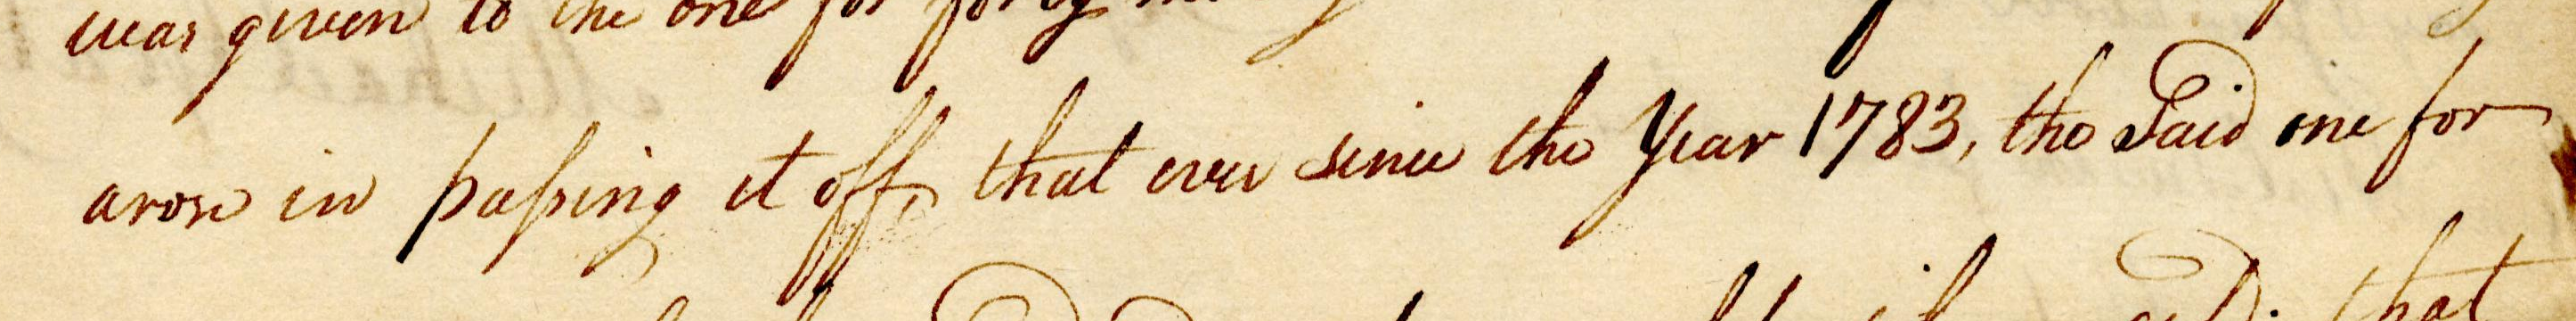arose in passing it off, that ever since the Year 1783. the said one for
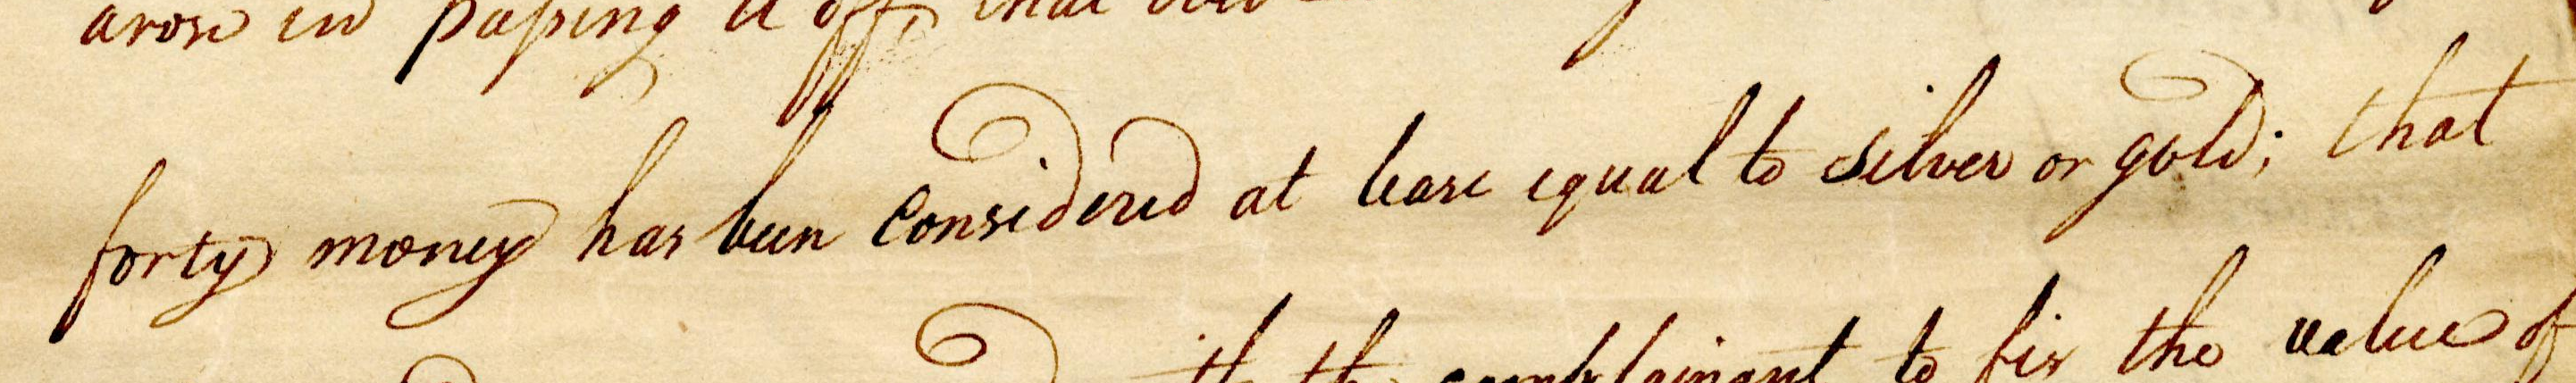forty money has been considered at base equal to silver or gold; that
